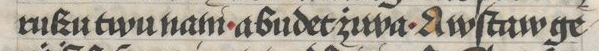ruku twu nani.a budet żiwa.A wſtaw ge¬
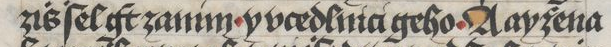żiṡ ẛel ḡt za ním.y vcedlnici geho.A ay żena
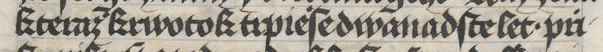kteraż krwotok trpieẛe dwanadſte let.pṙi¬
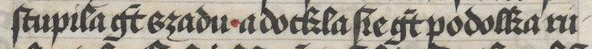ſtupila ḡt szadu.a dotkla ſie ḡt podolka ru¬
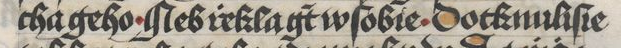cha geho.Neb ṙekla ḡt wſobie.Dotknuli ſie
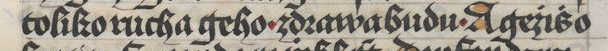toliko rucha geho.zdrawa budu.A geżíṡ o¬
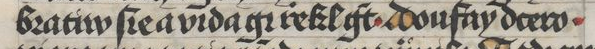bratiw ſie a vida g řekl ḡt.Doufay dcero.
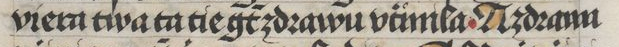viera twa tie ḡt zdrawu uċinila.A zdrawa
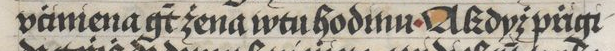vċiniena ḡt żena wtu hodinu.A kdyż pṙigi¬
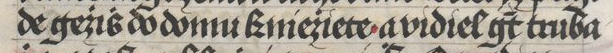de geżiš do domu kníeżiete.a vidiel ḡt truba¬
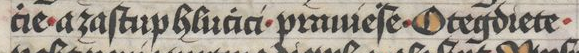ċie.a zaſtup hluċicí.prauieẛe.Otegdiete.
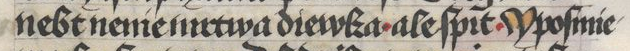nebt neníe mrtwa diewka.ale ſpit.Ypoſmíe¬
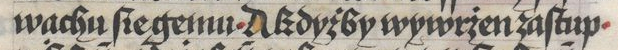wachu ſie gemu.Akdyżby wywrżen zaſtup.
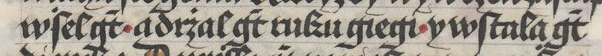wẛel ḡt.a drżal ḡt ruku giegi.y wſtala ḡt
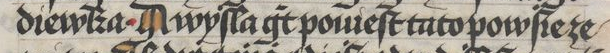diewka.A wyẛla ḡt pouieſt tato powẛie ze¬
